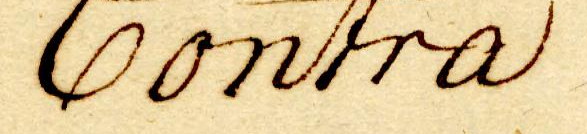Contra
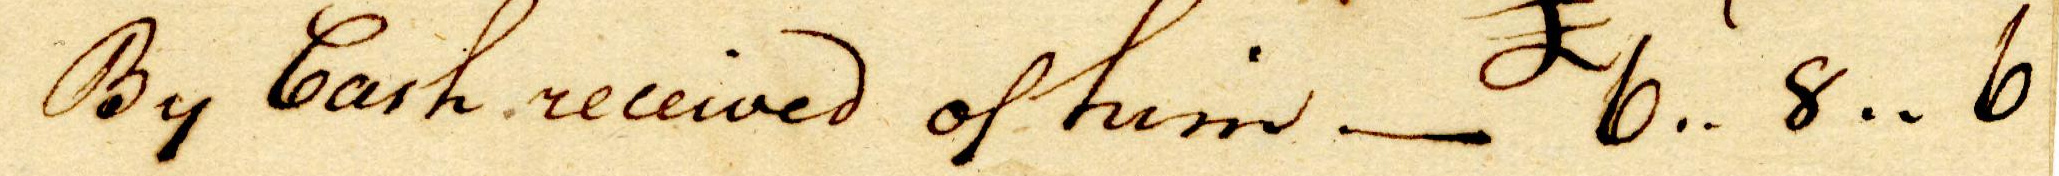By Cash received of him £6.. 8.. 6
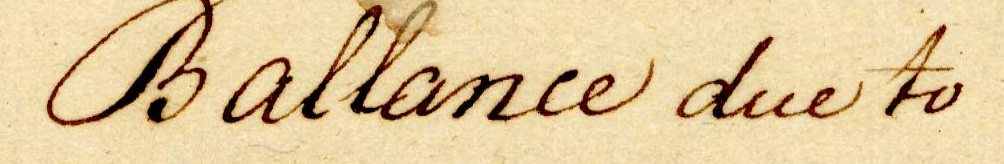Ballance due to
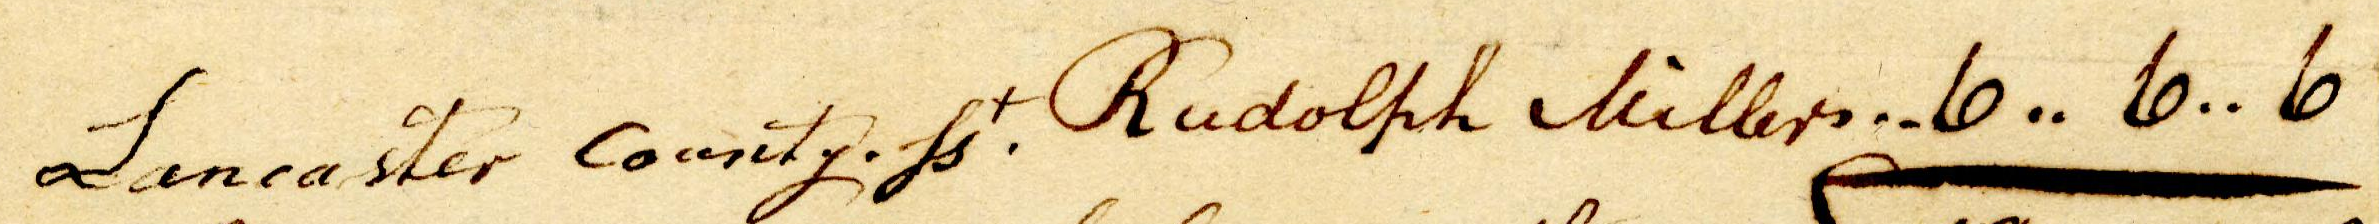Lancaster County. p^t. Rudolph Miller ..6.. 6.. 6
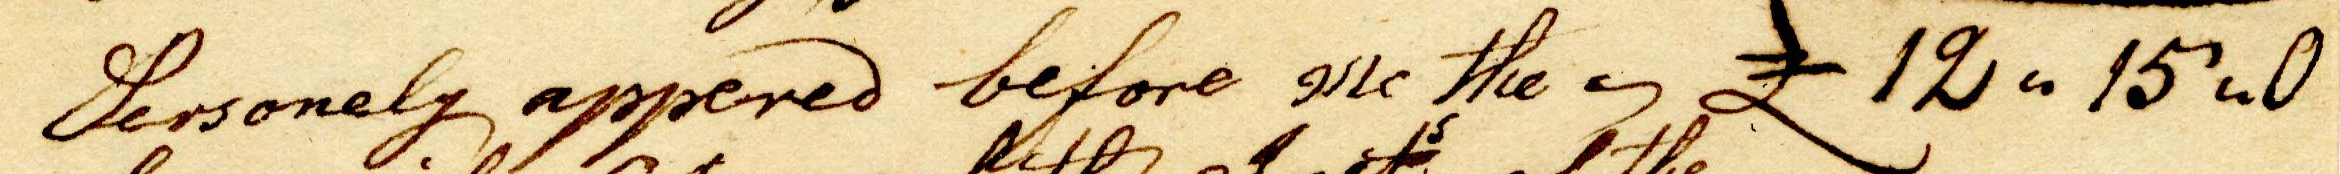Personely appered before me the £ 12.. 15.. 0
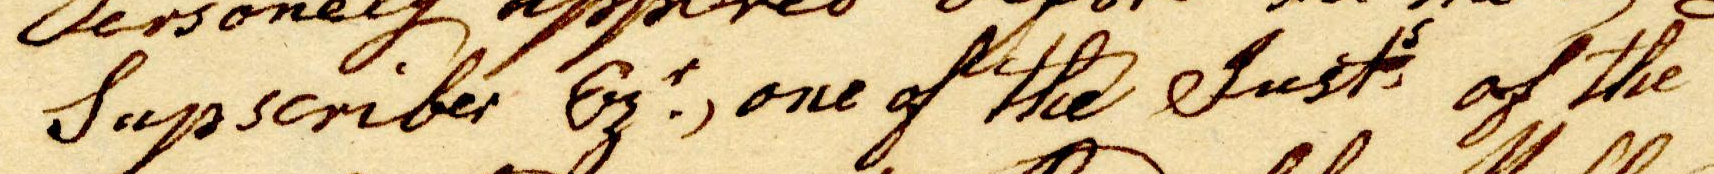Supscriber Ez^r. one of the Justs of the
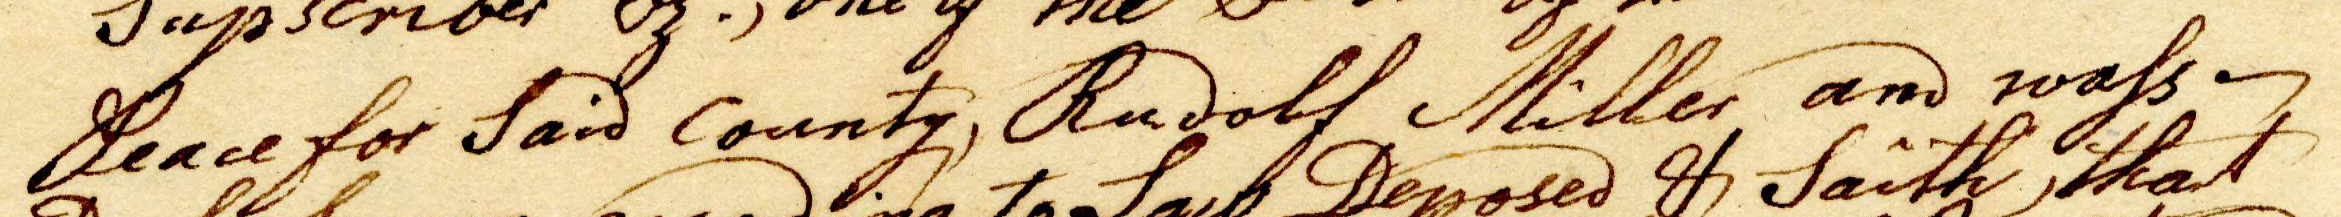Peace for said County, Rudolf Miller and wass
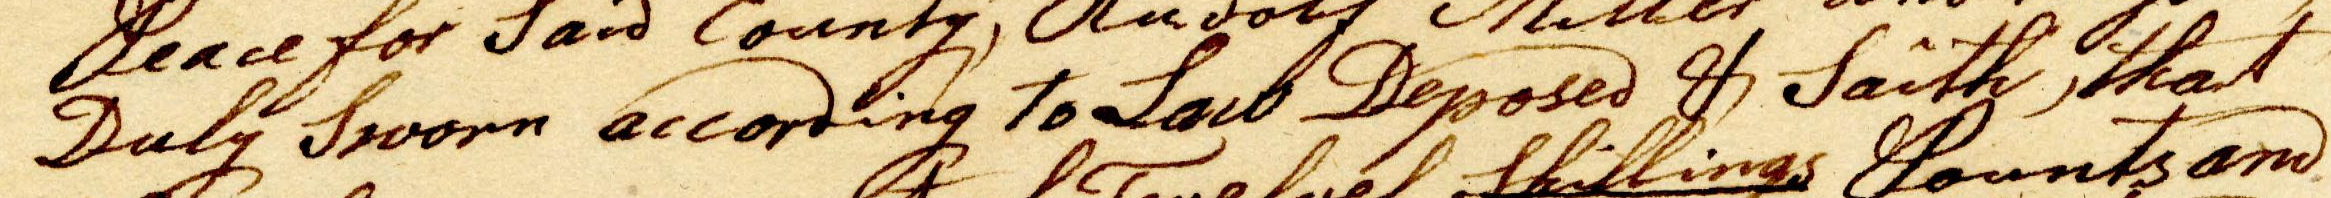Duly Sworn according to Law Deposed & Saith, that
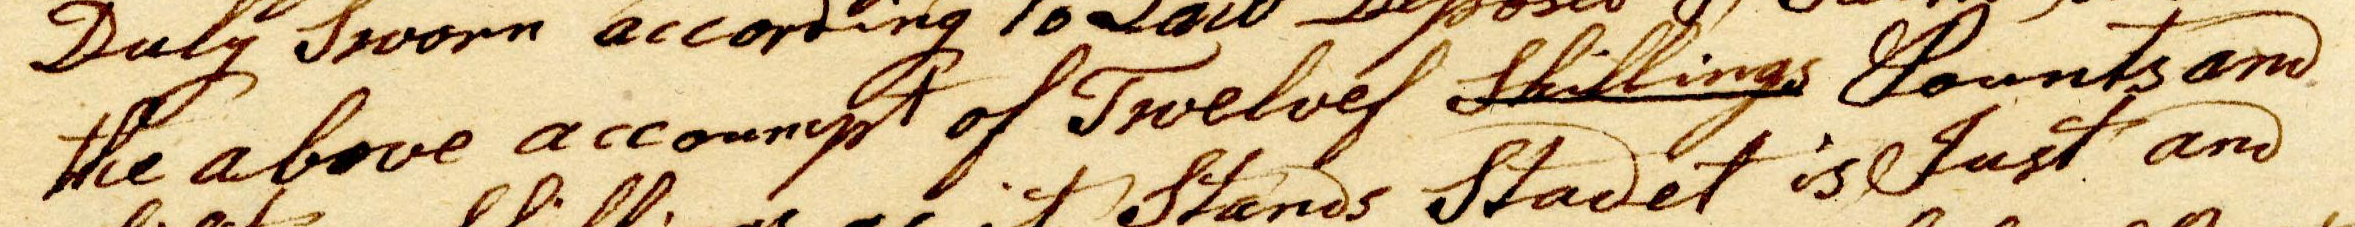the above account of Twelve shillings Pounts and
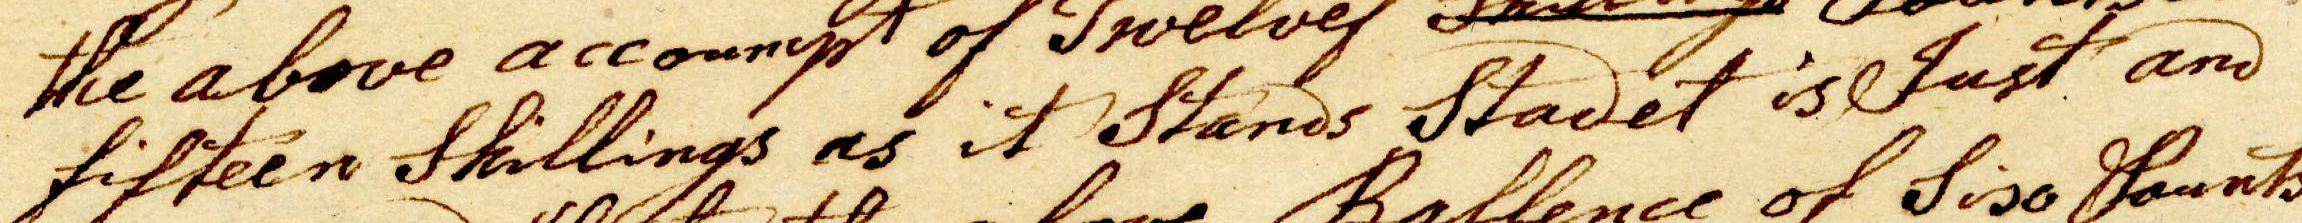fifteen Shillings as it Stands Stadet is Just and
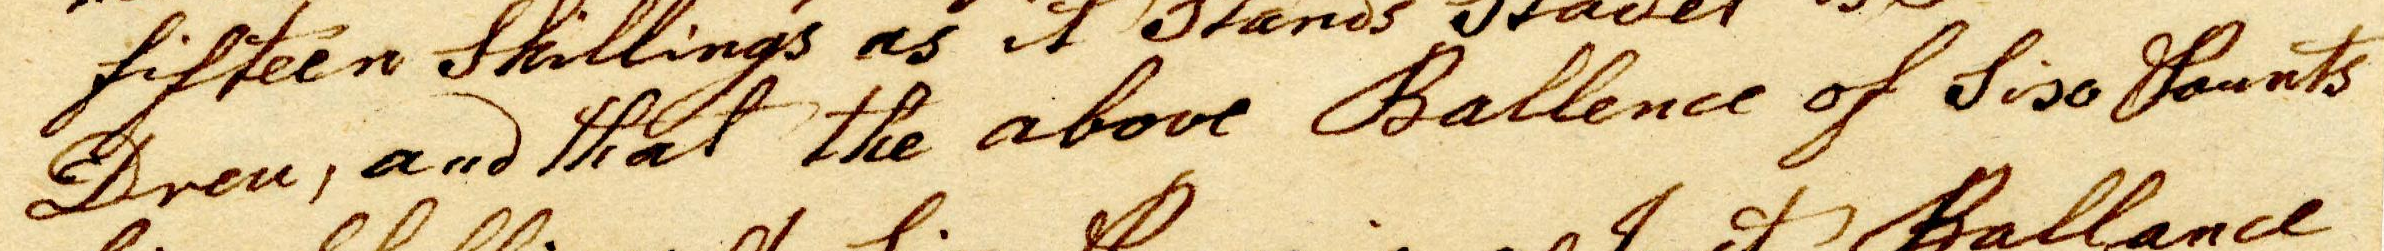Drew, and that the above Ballence of Six Pounts
